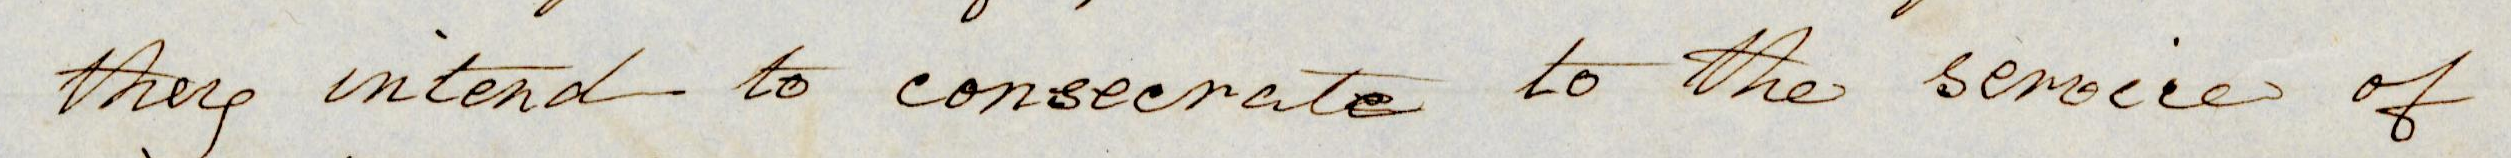they intend to consecrate to the service of
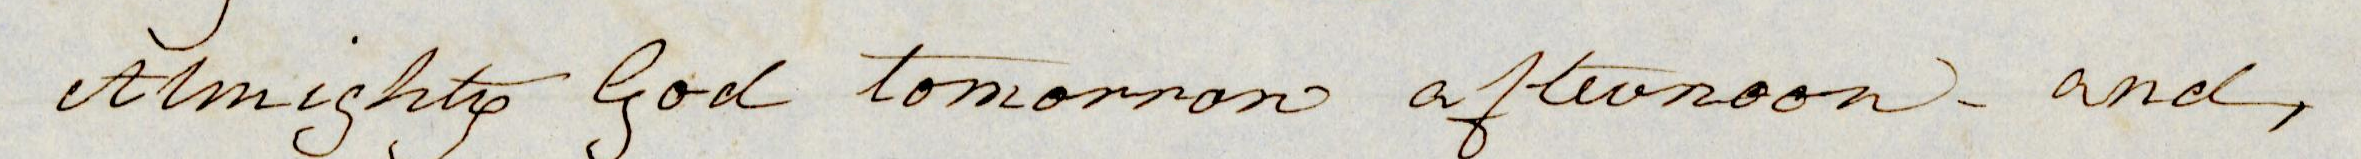Almighty God tomorrow afternoon, and
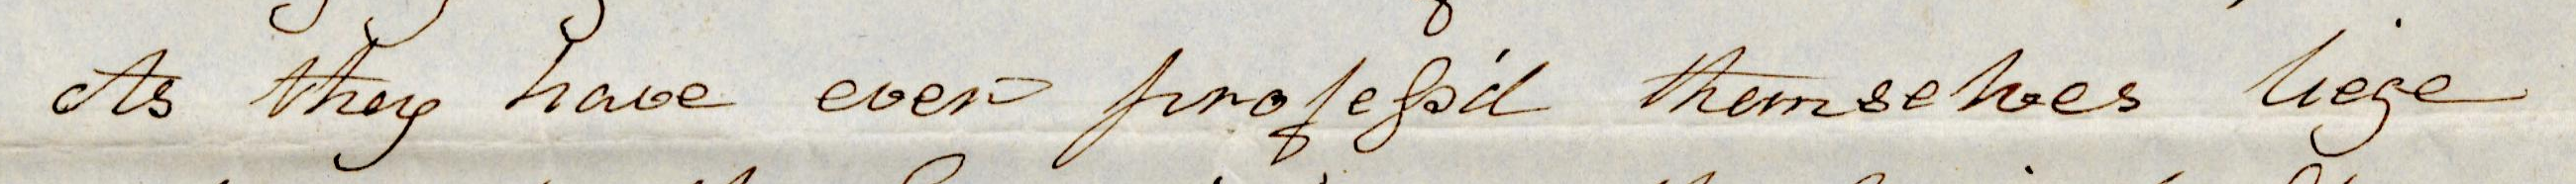As they have ever professed themselves liege
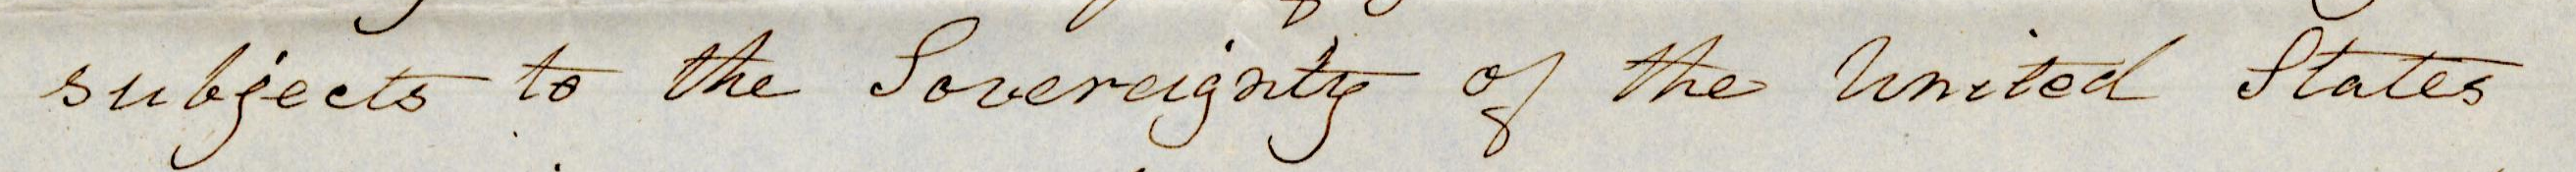subjects to the Sovereignty of the United States
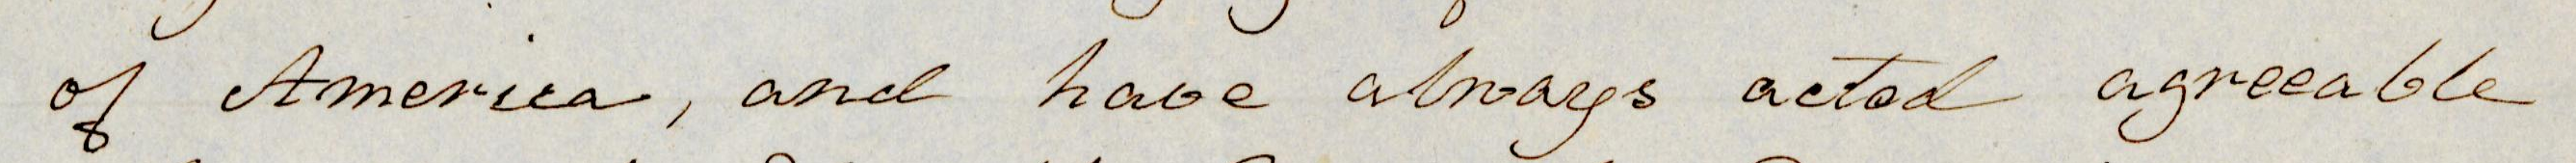of America, and have always acted agreeable
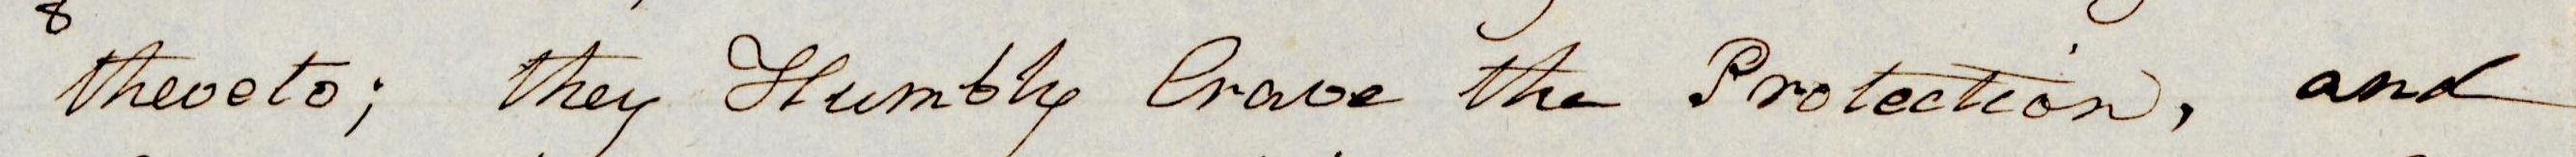thereto; they Humble crave the Protection, and
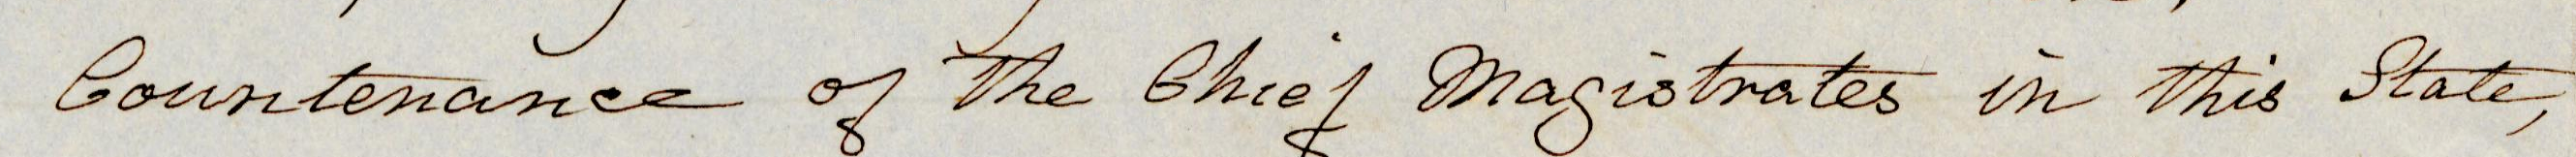Countenance of the Chief Magistrates in this State,
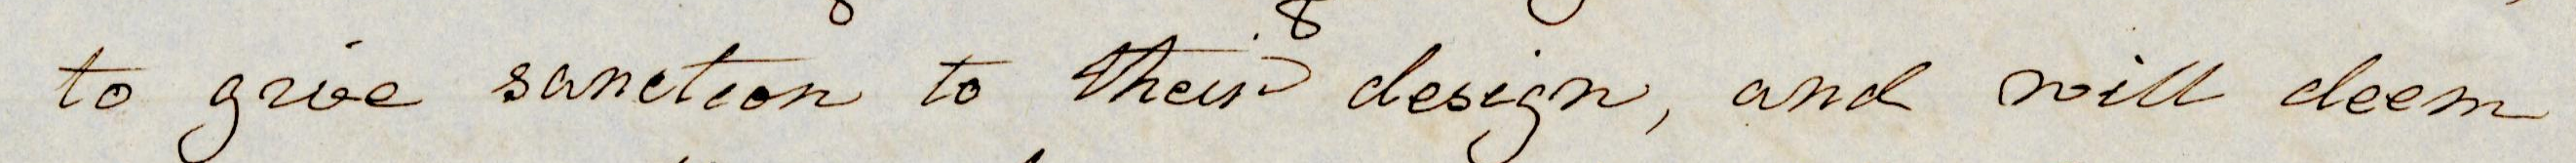to give sanction to their design, and will deem
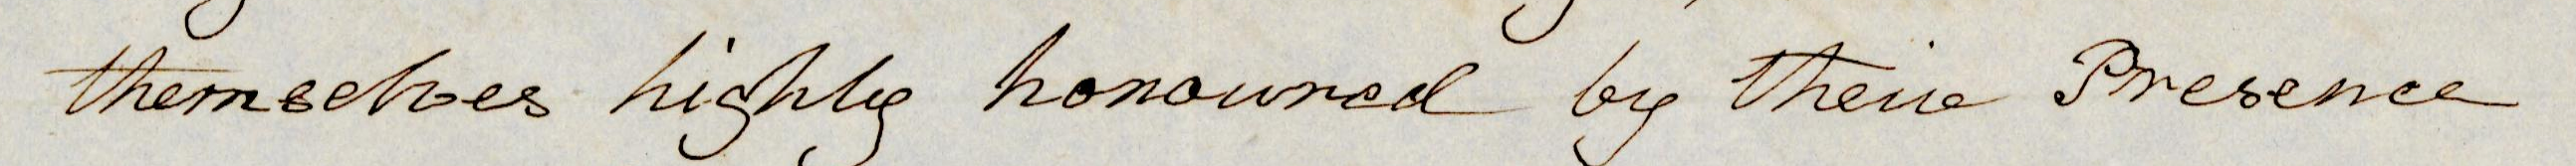themselves highly honoured by their Presence
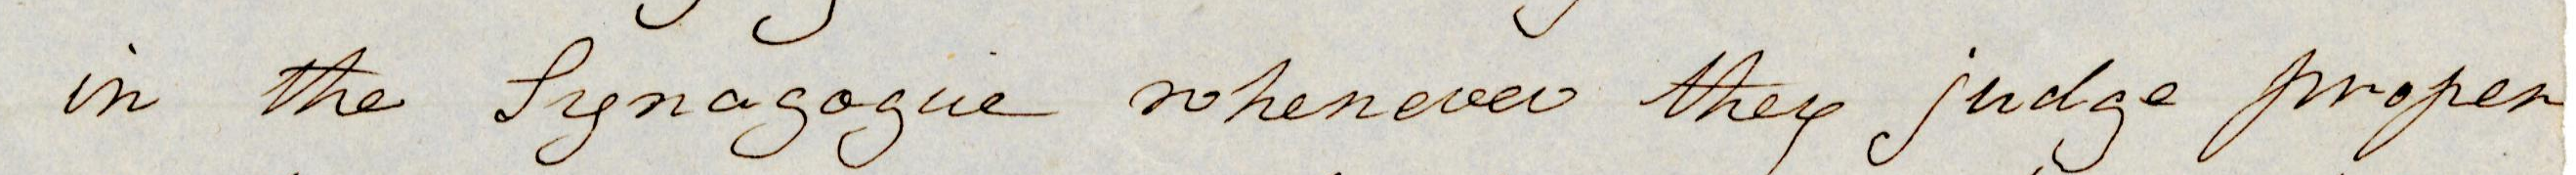in the Synagogue whenever they judge proper
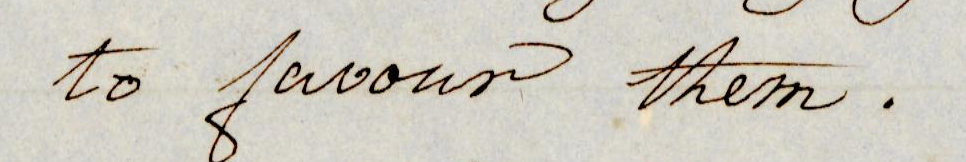to favour them.
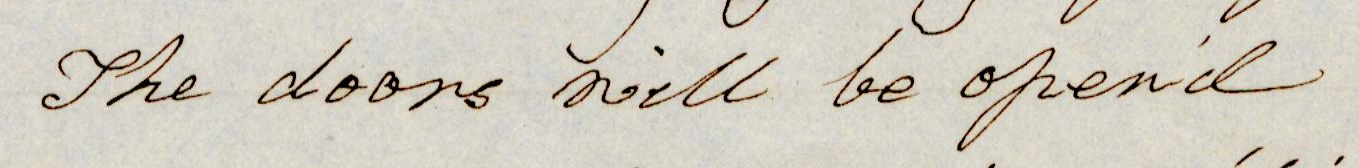The doors will be opened
